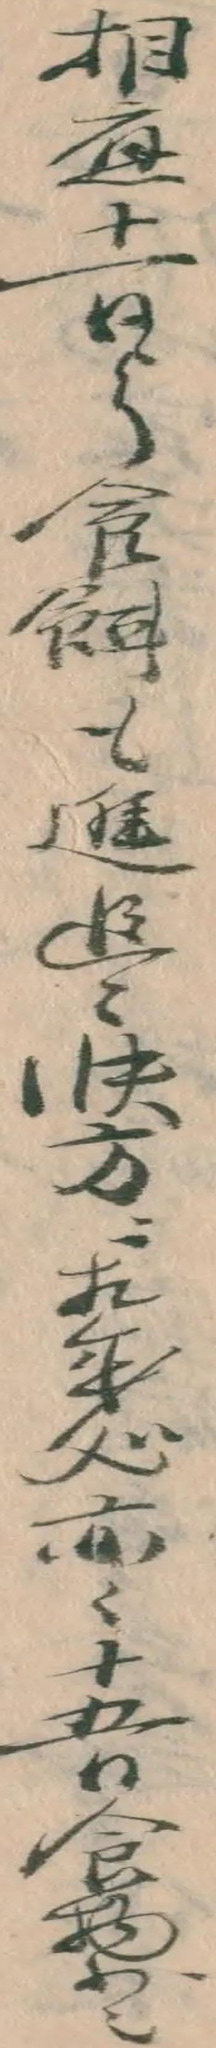相應十一日より食餌も進追々快方二相成処亦々十五日食物少シ
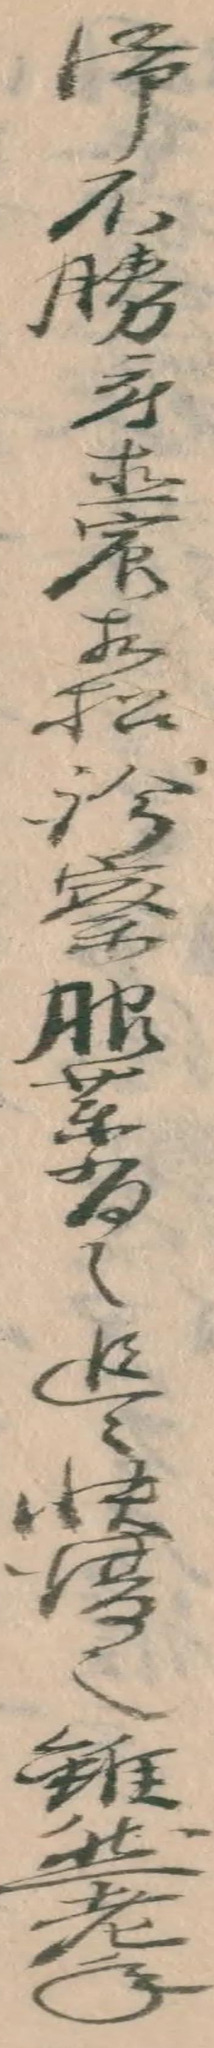滞不勝ニ付身直寝相招診察服薬有之追々快復也雖然老年
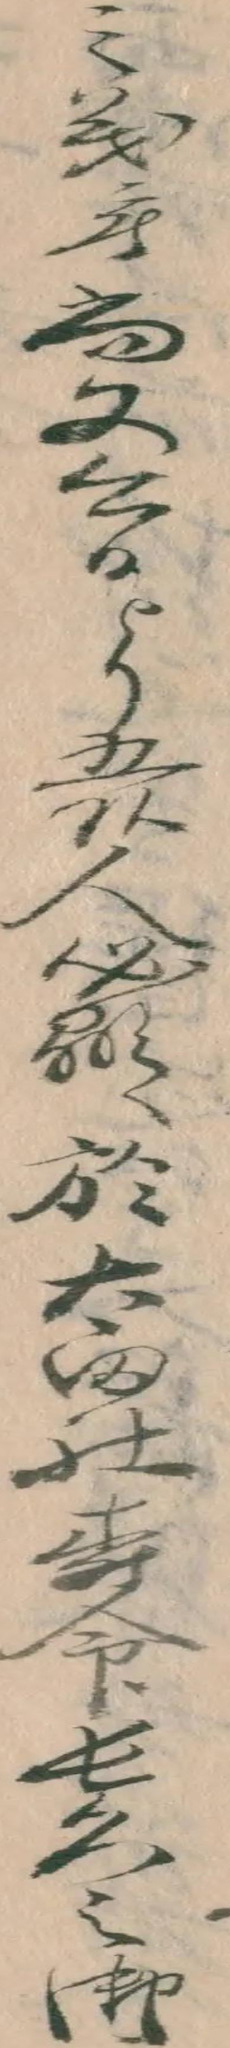之義ニ付尚又今日より五頭人必顕へ於太田社壽命長久之御
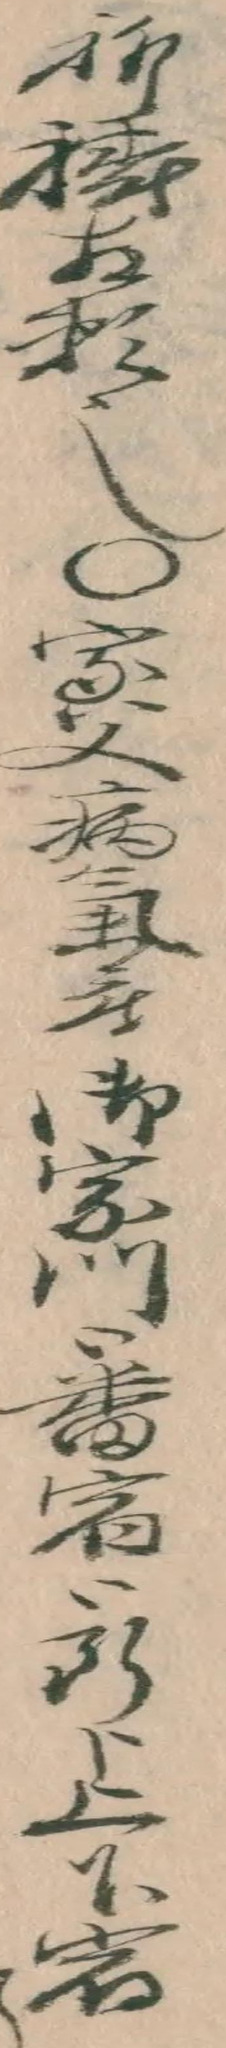祈祷相頼也○家父病氣ニ付御家門御番宿御断申上下宿了
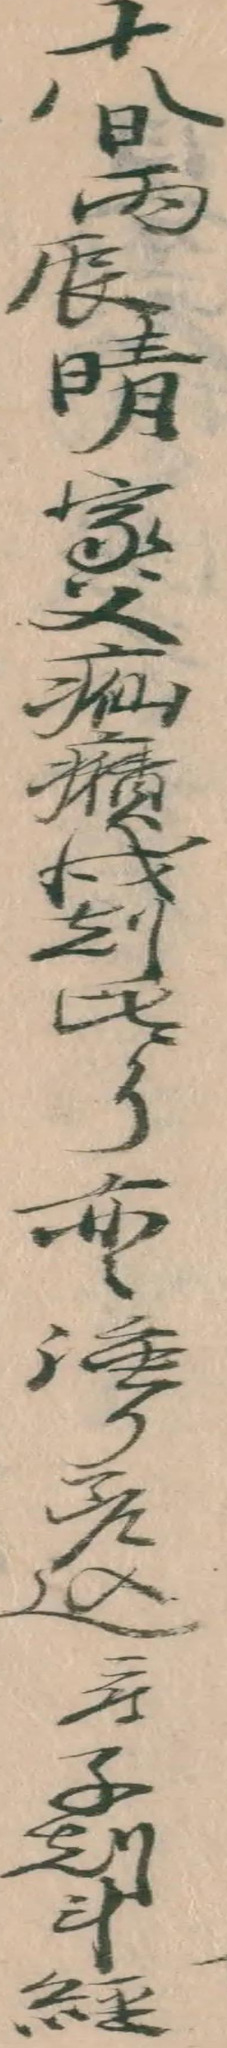十八日丙辰晴家父疝癪戌刻比より亦々強ク差込二付子刻斗経
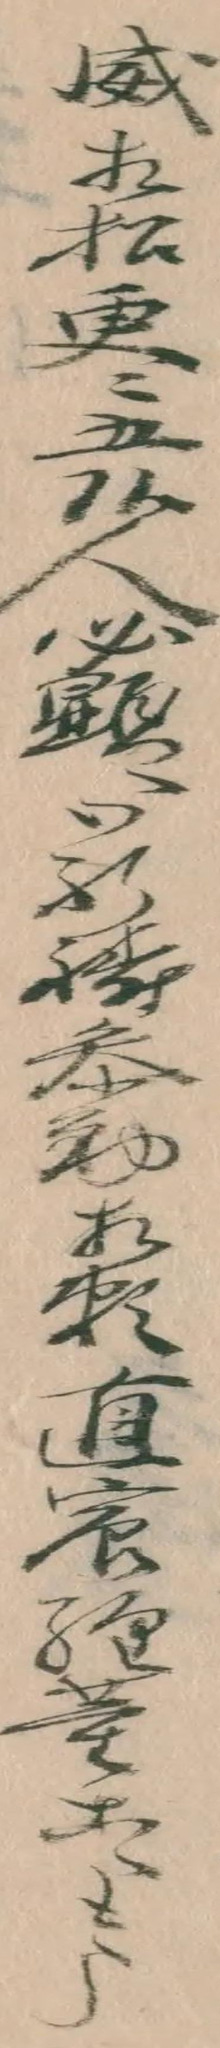威相招更二五頭人必顕へ御祈祷参勤相頼直寝経董等へも申
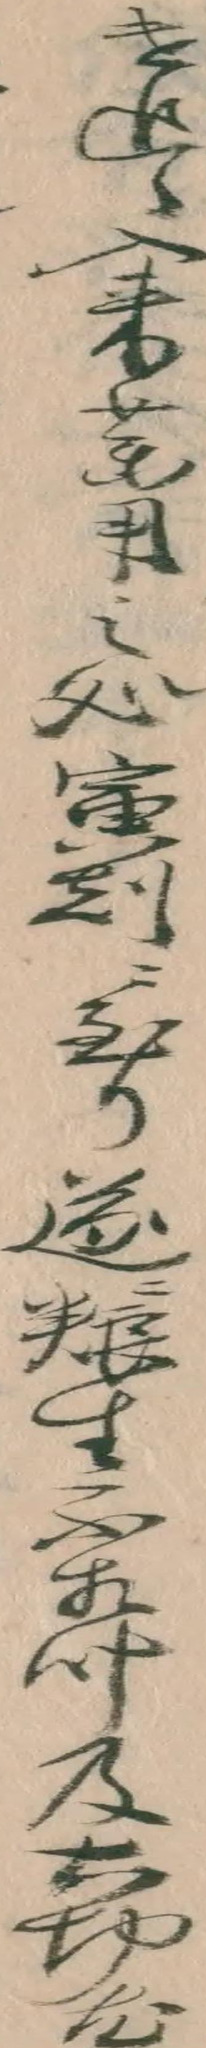遣追々入来薬用之処寅刻ニ至り逆粮生不相叶及大切尤
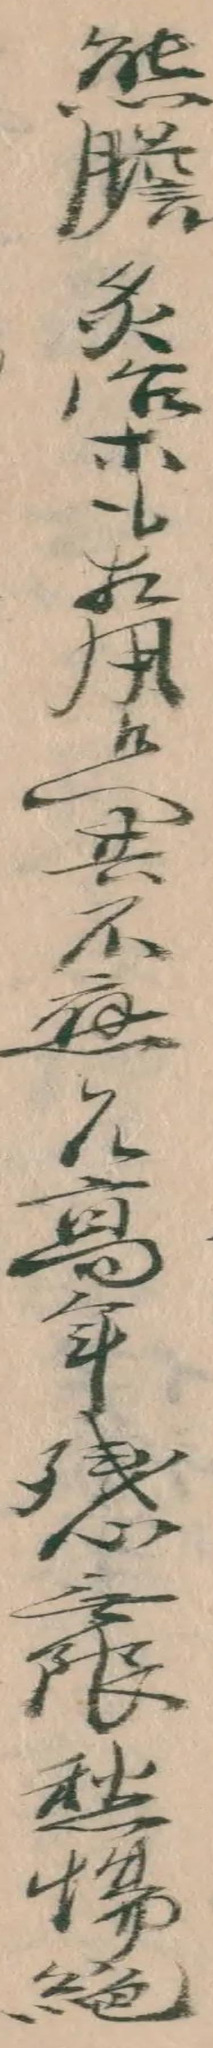熊膽炙治等も相用候へ共不應乍高年残心無限愁傷絶
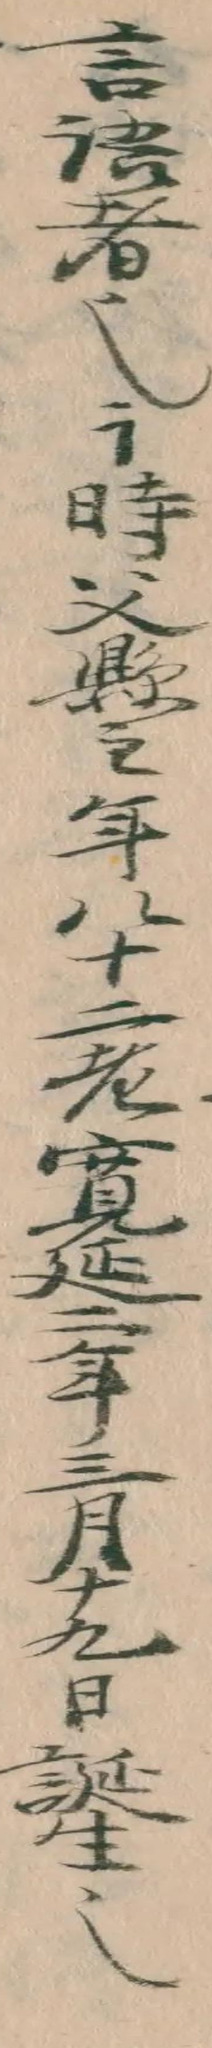言語者也于時父縣主年八十二老寛延二年三月十九日誕生也
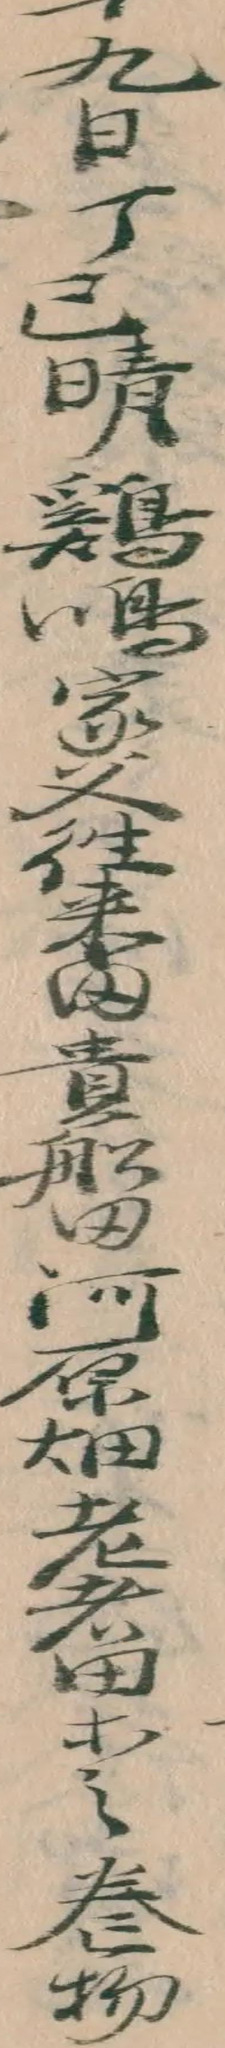十九日丁巳晴鶏鳴家父往来由貴舩田河原畑老者田等之巻物
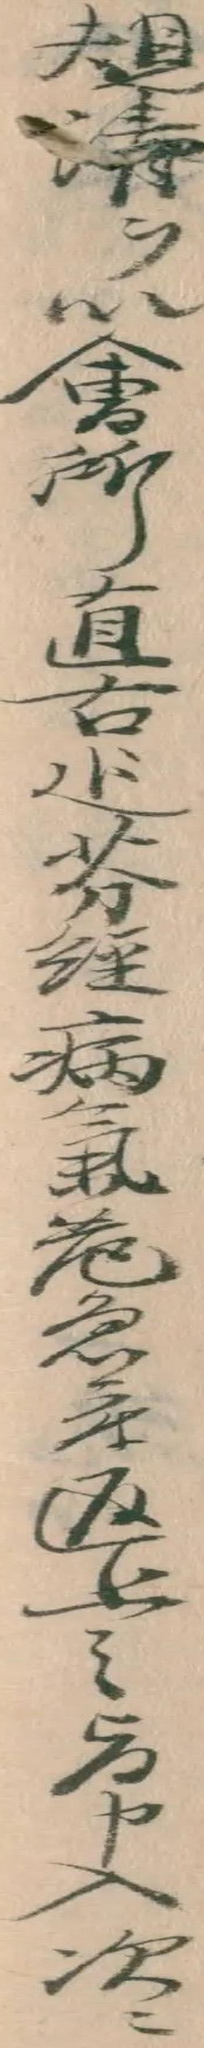規清ヲ以會所直古迄芬経病氣危急ニ付返上之旨申入次ニ
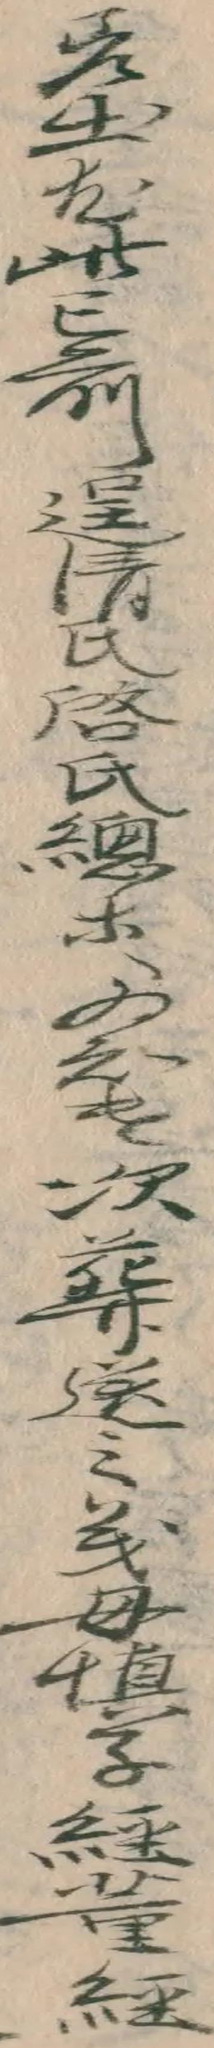差出尤此已前逞清氏啓氏總等へ為知遣次葬送之義母慎子経董経
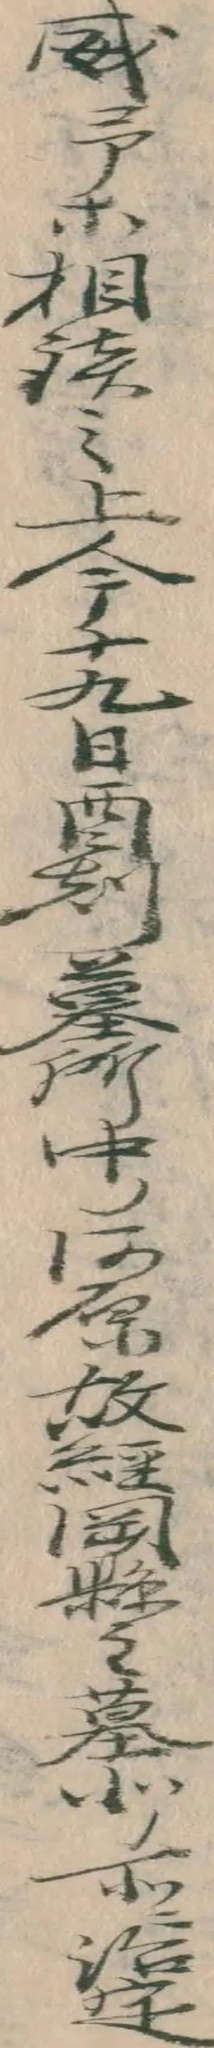威予等相談之上今十九日酉刻墓所中河原故経岡縣主墓北ノ所治定
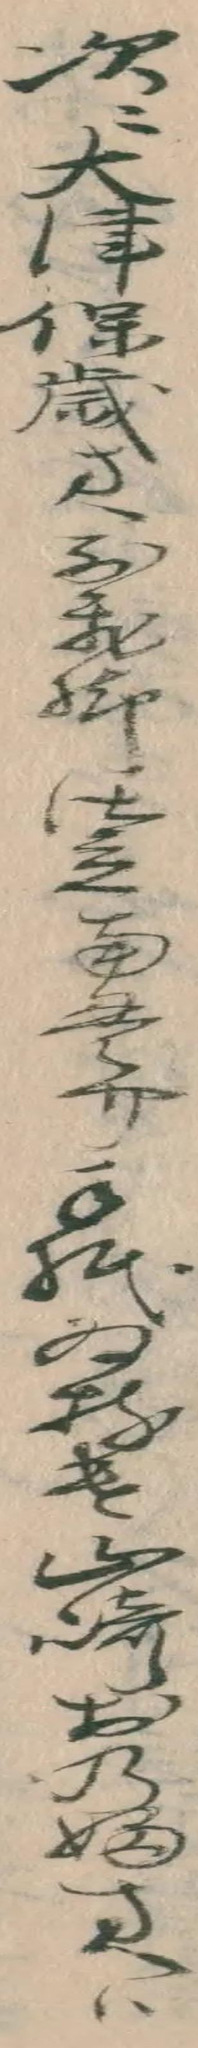次ニ大津保歳方へ別飛脚仕立南無之介手紙為持遣山崎おのふ方へハ
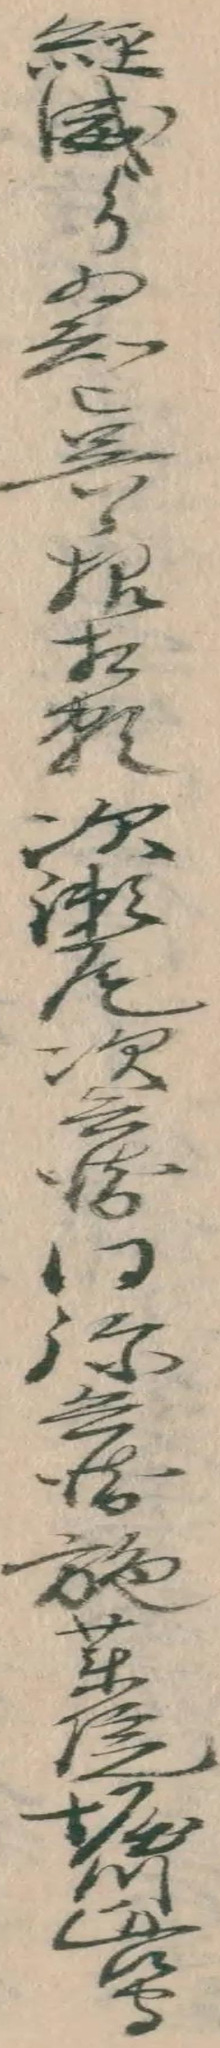経威より為知被呉候様相頼次瀬尾次兵衛同弥兵衛施薬院堀川近江守
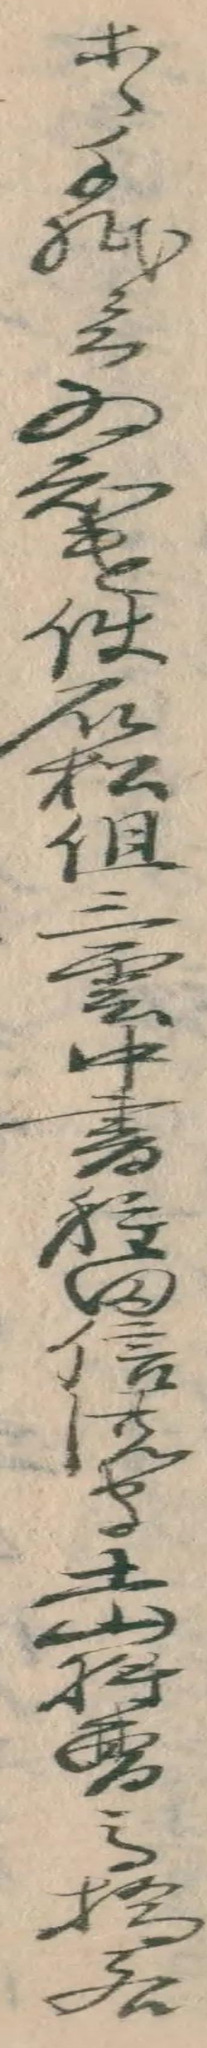等へ手紙ニ而為知遣使石松但三雲中書種田信濃守土山将曹高橋若
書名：賀茂社記録. 第65冊
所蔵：国立国会図書館 National Diet Library, JAPAN
